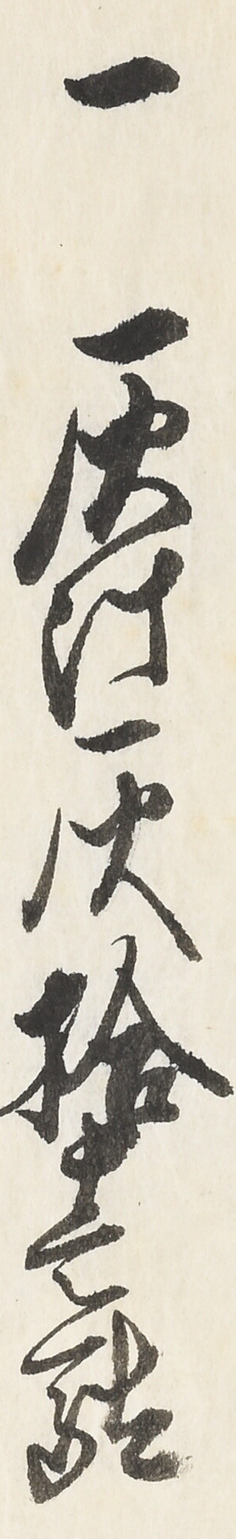一灰汁灰拾壱駄但
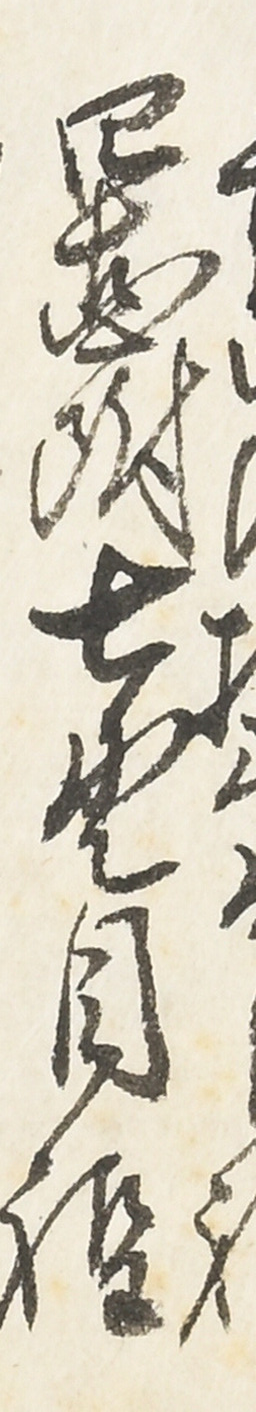四固ニ付七貫目程
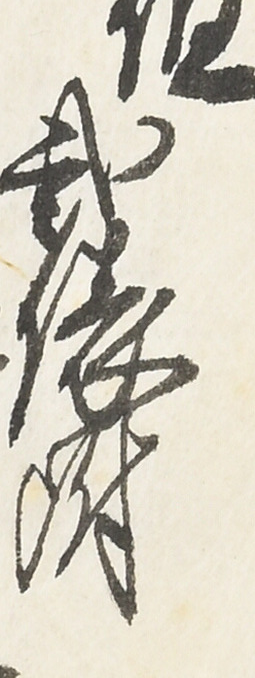弐俵附
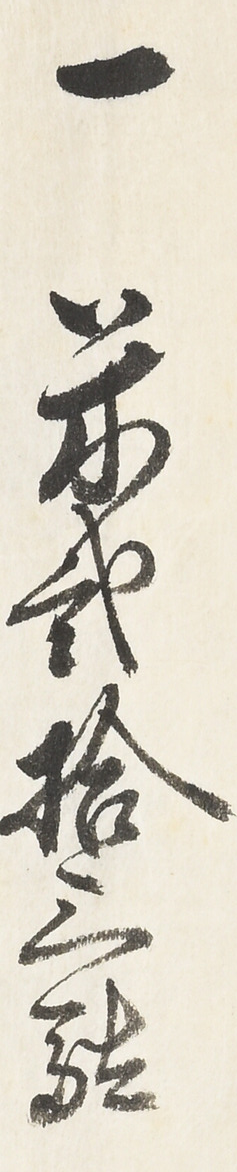一米弐拾三駄但
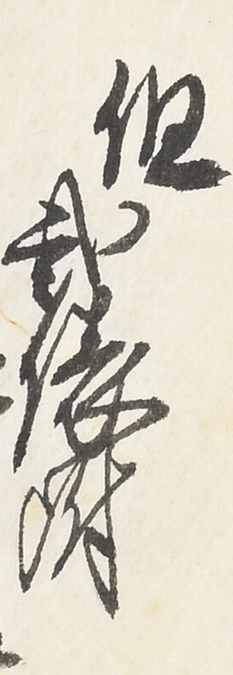弐俵附
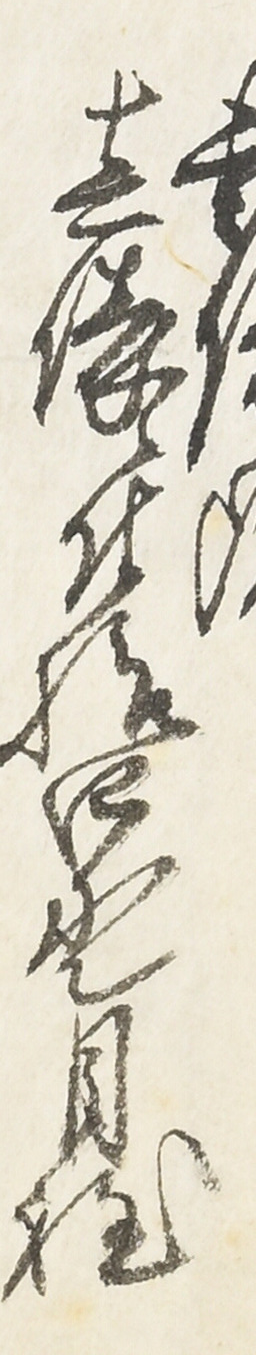壱俵ニ付拾四貫目程
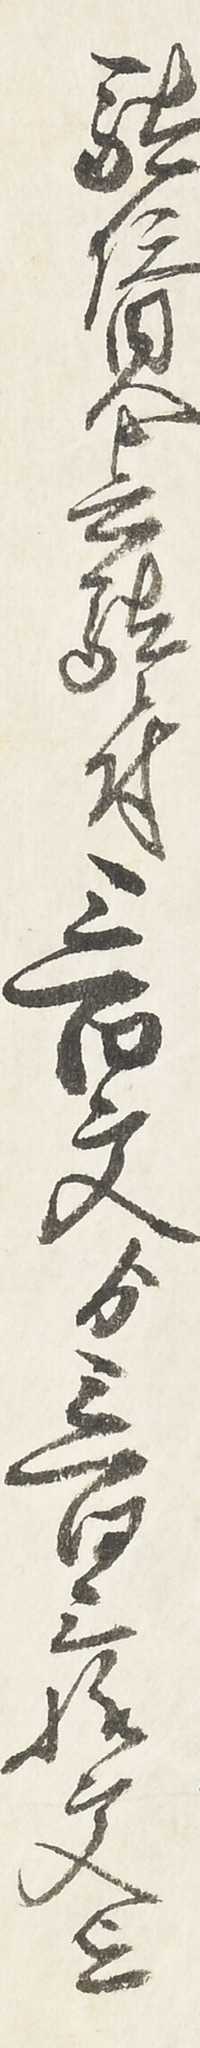駄賃壱駄ニ付三百文ゟ三百五拾文迄
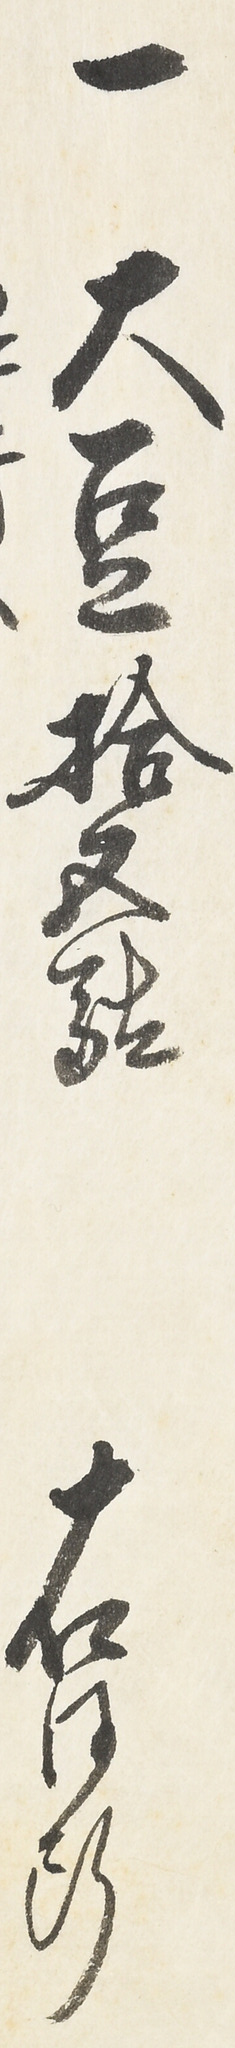一大豆拾五駄右同断
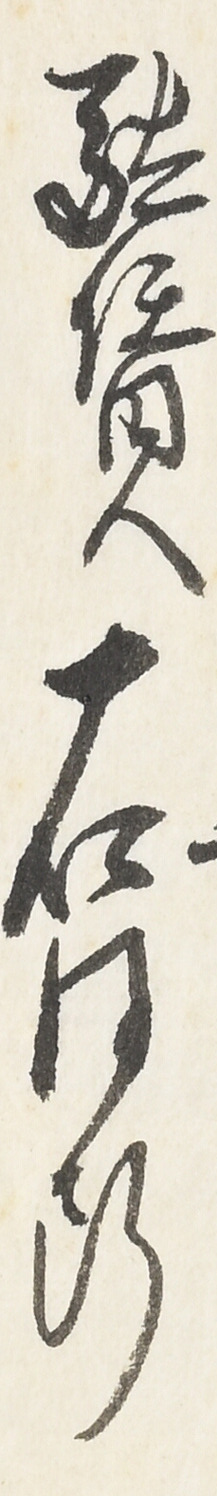駄賃右同断

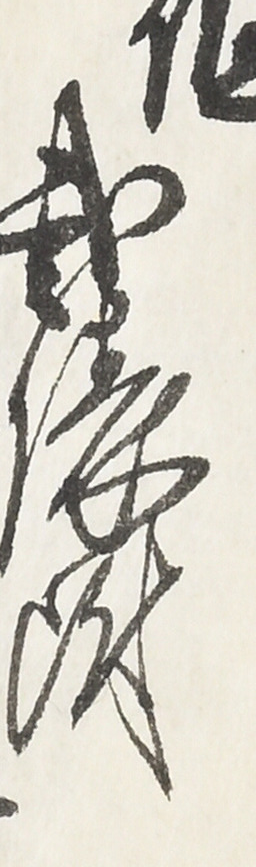弐俵附
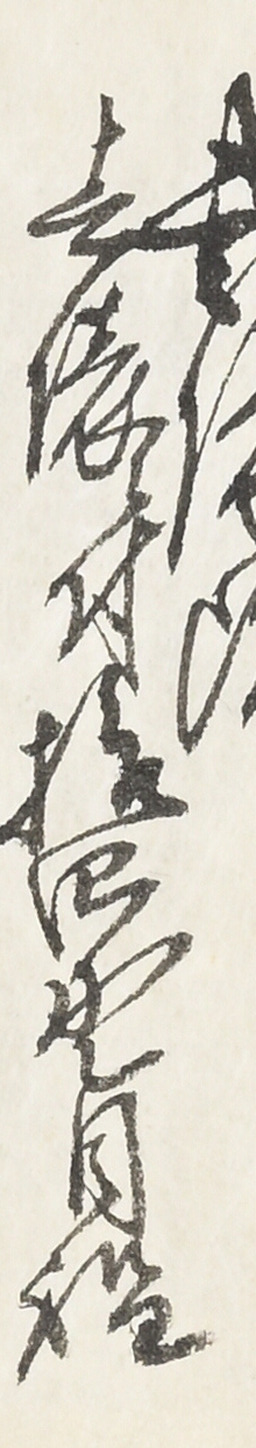壱俵ニ付拾四貫目程
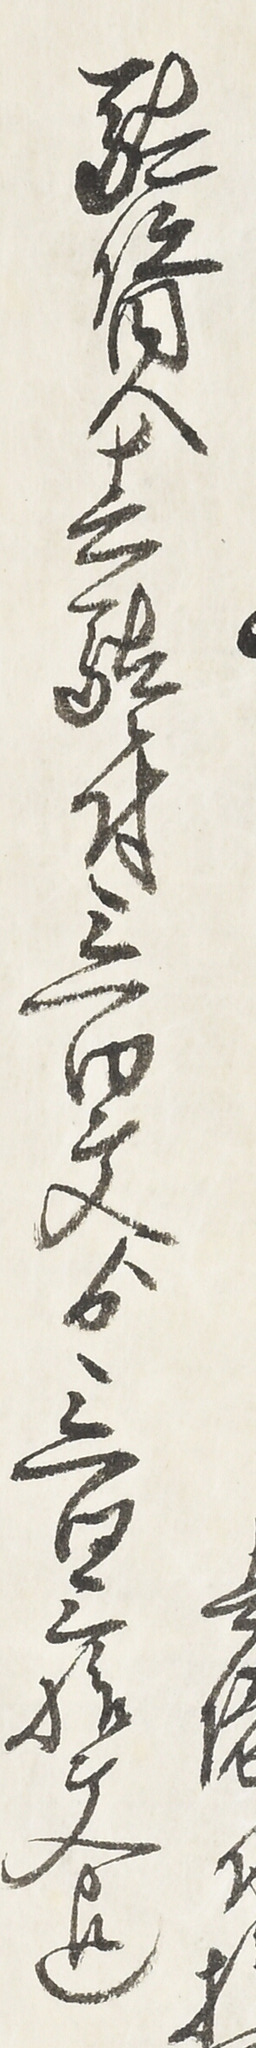駄賃壱駄ニ付三百文ゟ三百三拾文迄
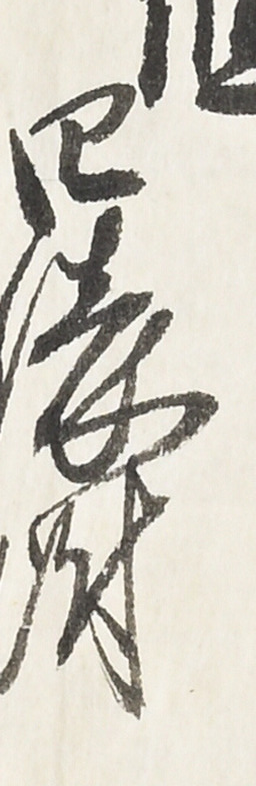四俵附
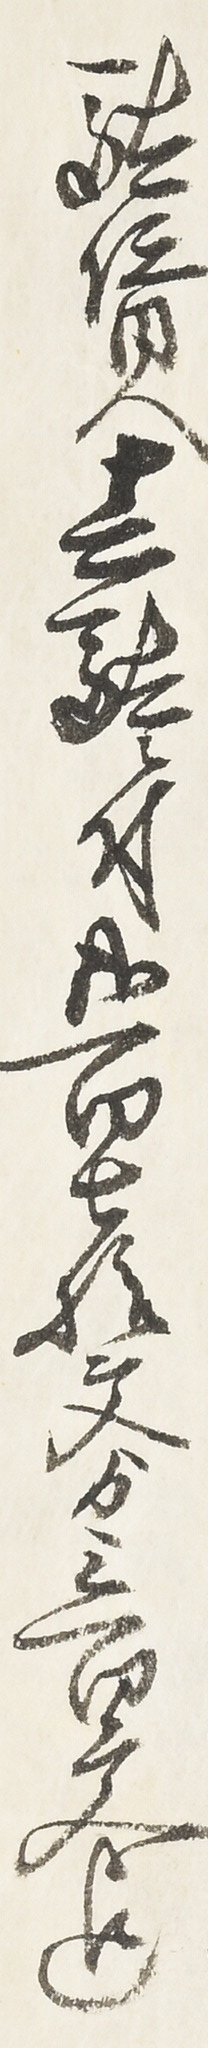駄賃壱駄ニ付弐百七拾文ゟ三百文迄
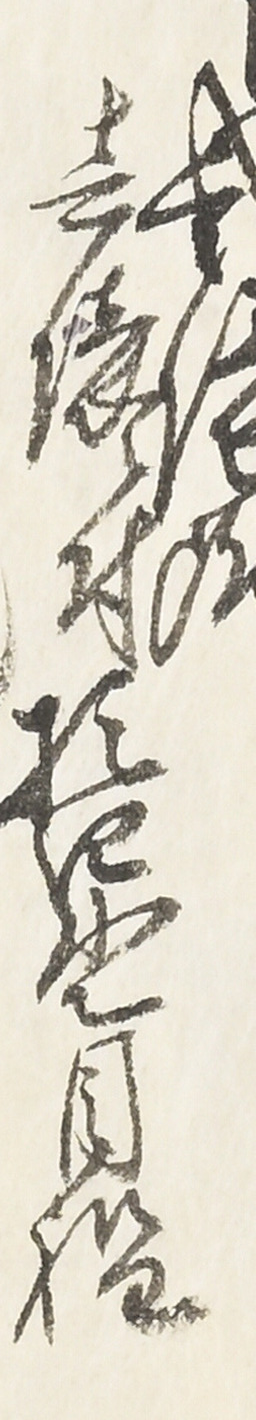壱俵ニ付拾四貫目程
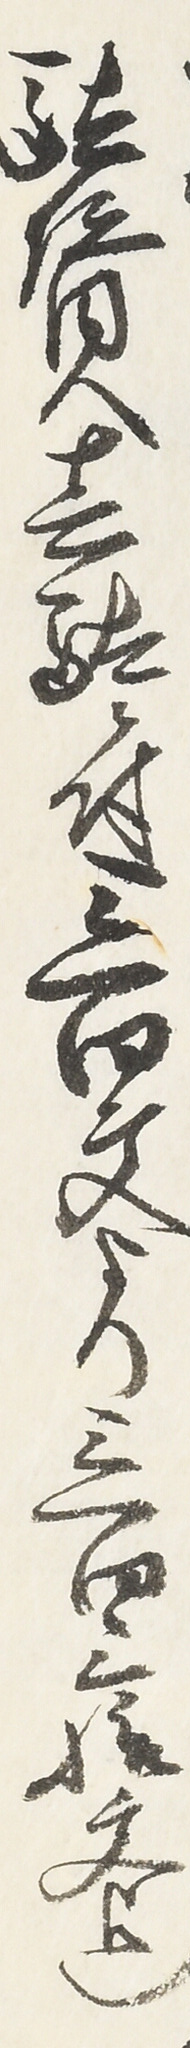駄賃壱駄ニ付三百文より三百三拾文迄
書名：中馬ニテ附通候出入荷物目録帳
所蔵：伊那市立高遠町図書館・合同会社AMANE
